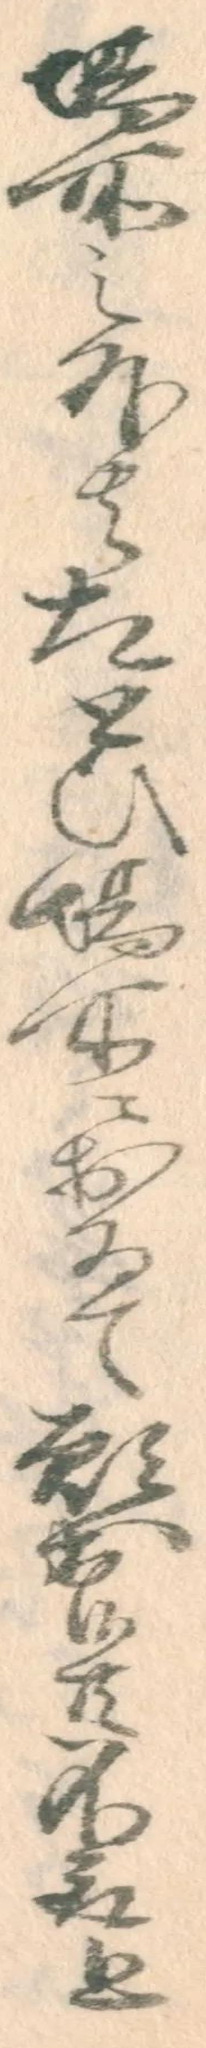場所之外はたとひ場所ニおゐて願出候共不取上
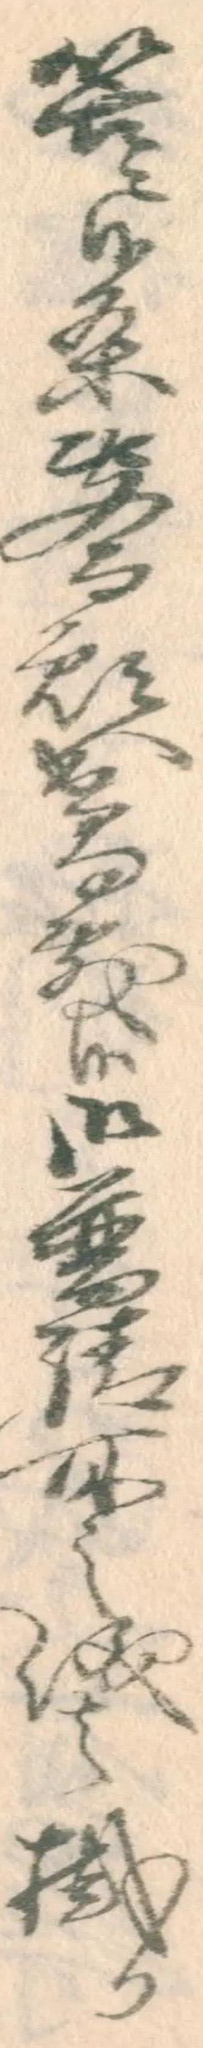筈ニ候条決而願出間敷候御普請所之儀は掛り
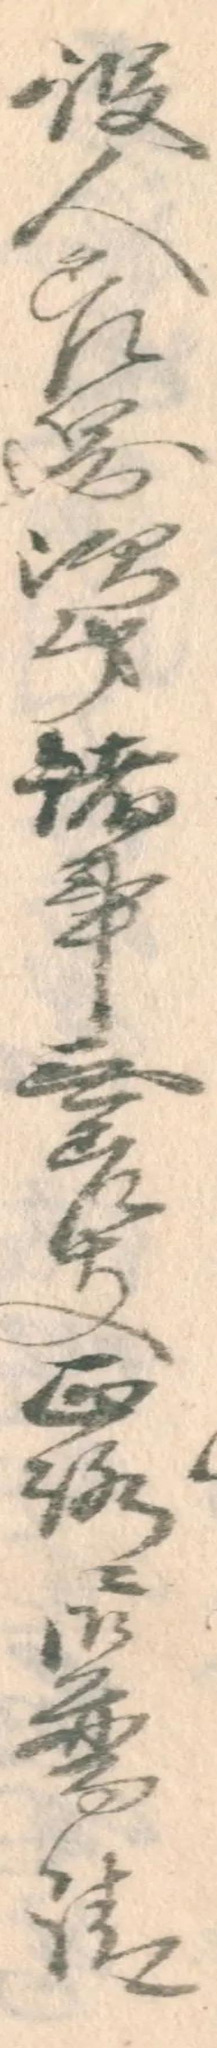役人差図次第諸事無差支正路ニ御普請
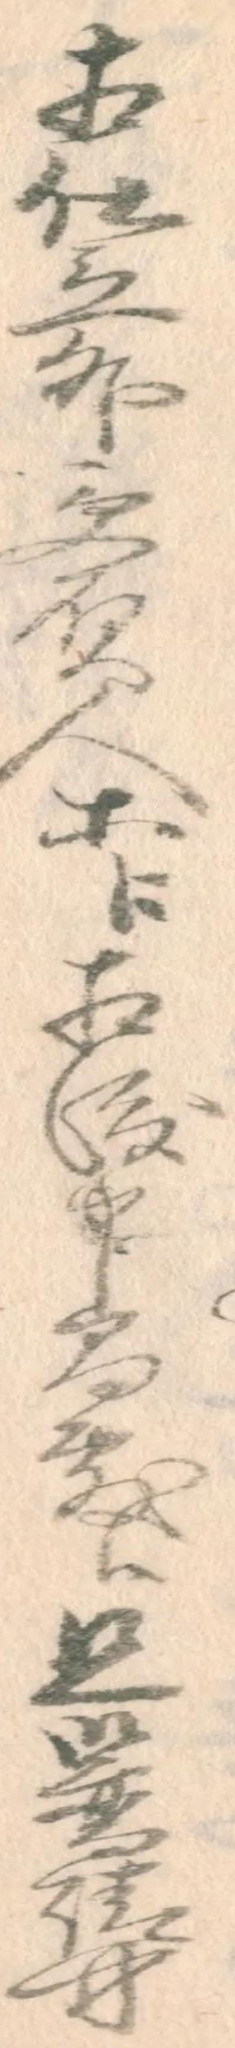相仕立外受負人等江相渡申間敷候且御普請中
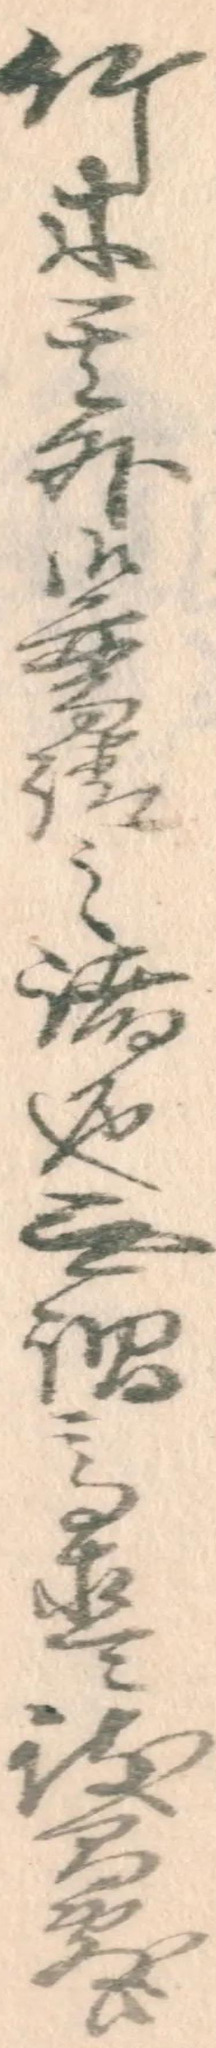竹木其外御普請之諸色無謂高直ニ致間敷候
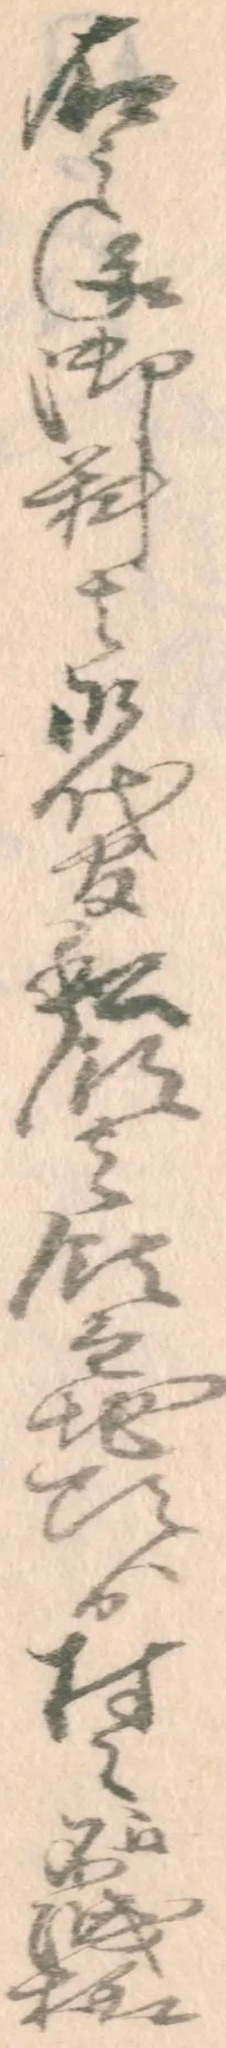右之趣御料は御代官私領は領主地頭ゟ村々え不洩様
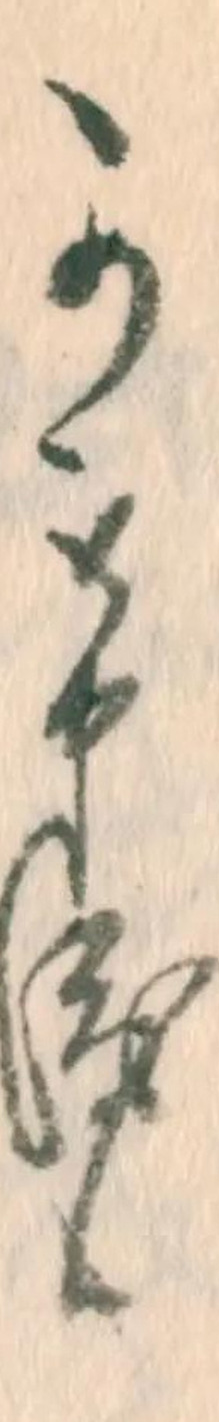可被申渡候
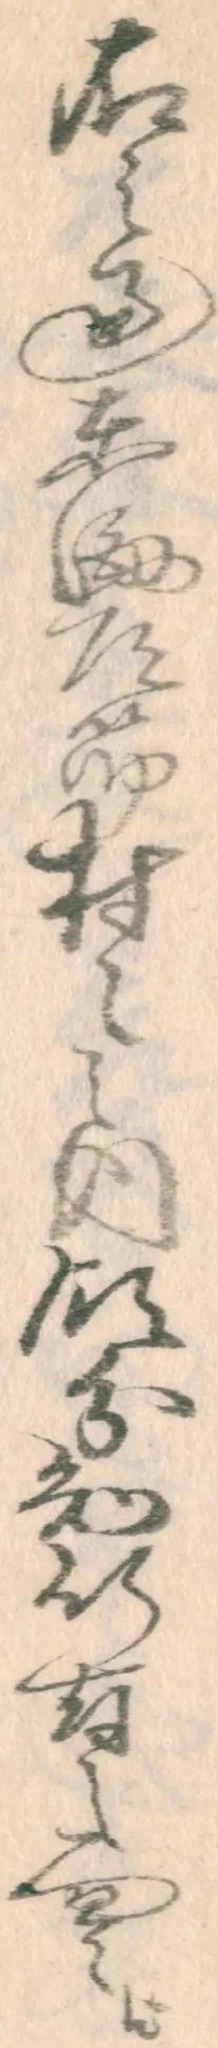右之通東海道筋村々之内領分知行有之面々え
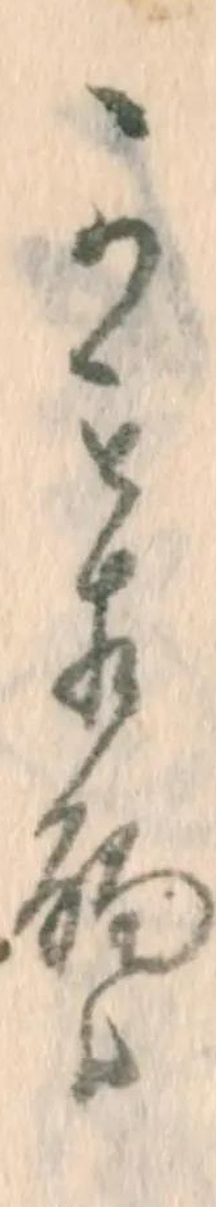可被相触候
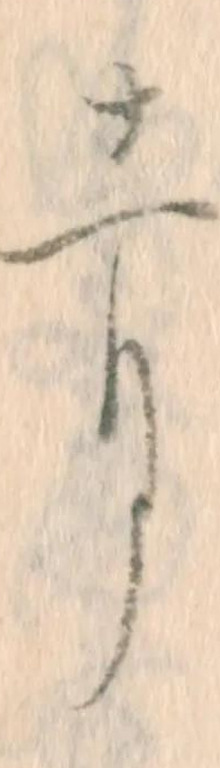十一月
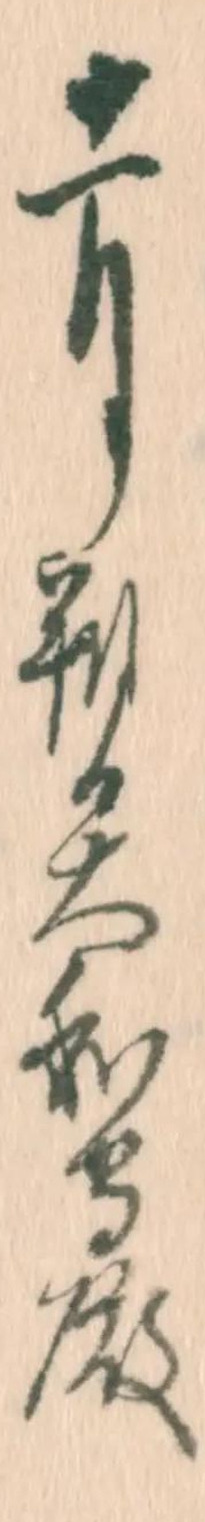十一月朔日大和守殿
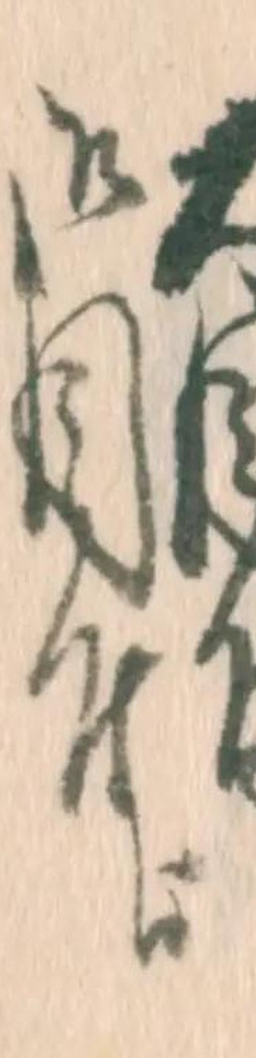大目付え
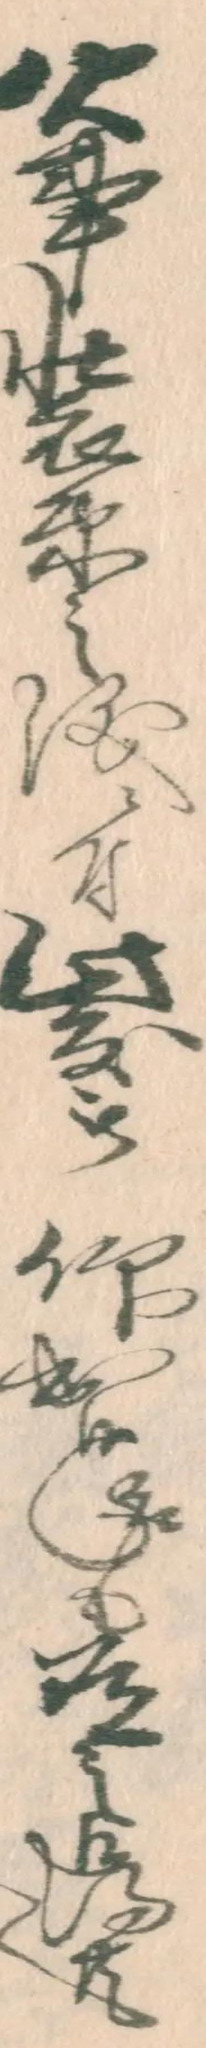火事装束之儀ニ付此度被仰出候趣も有之候得共
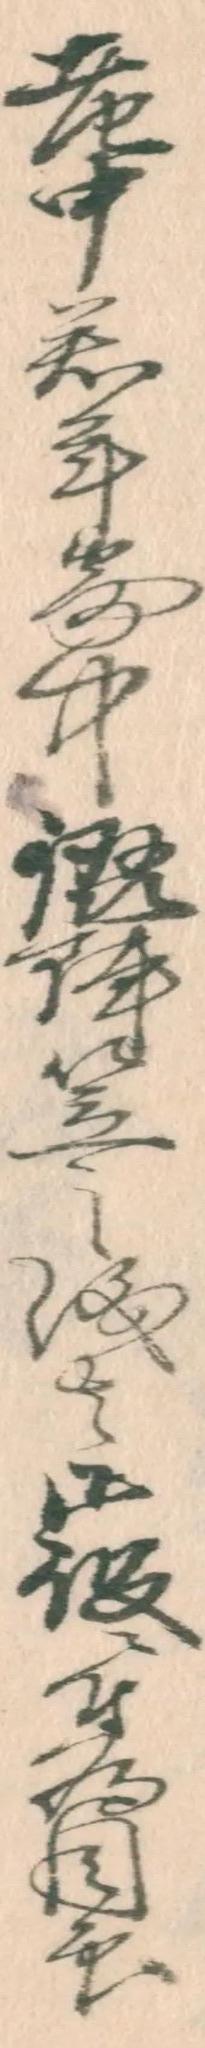老中若年寄中錣陣笠之儀は御役ニ付為目印
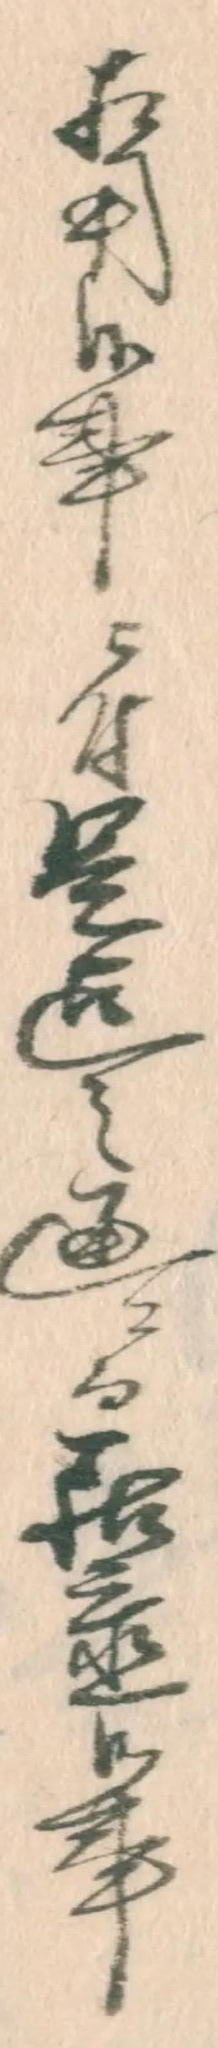相用候ニ付是迄之通ニ而居置候事
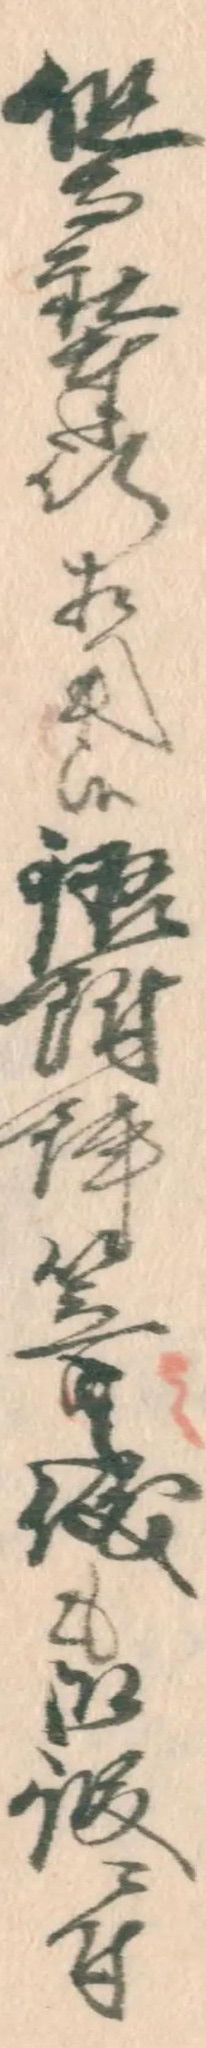但寺社奉行相用候錣附陣笠之儀も御役ニ付
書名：地震災書留 2巻. [1] 内表紙に「地震災書留　安政二卯年　但本所深川御用屋敷地代免除調」とあり
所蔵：国立国会図書館 National Diet Library, JAPAN
